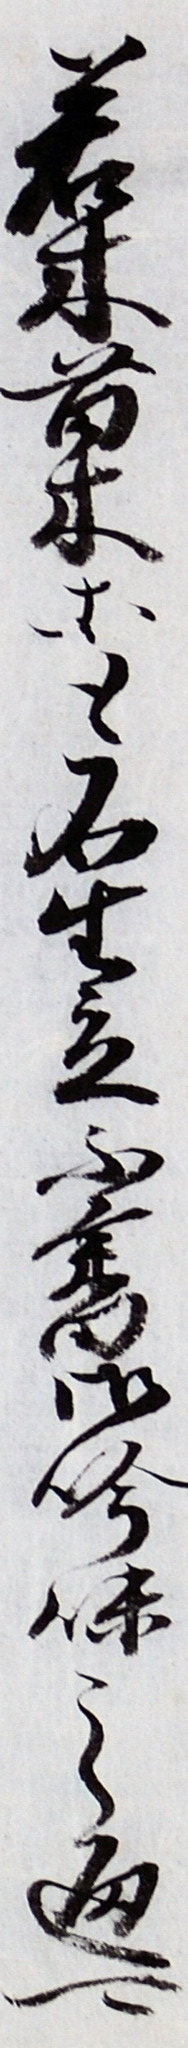若木苗木等も不生立不審御吟味之通可
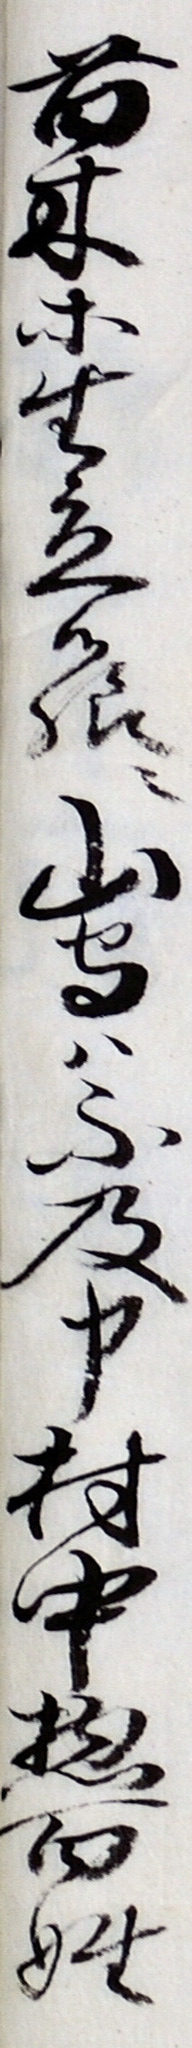苗木等生立候様に山守は不及申村中惣百姓
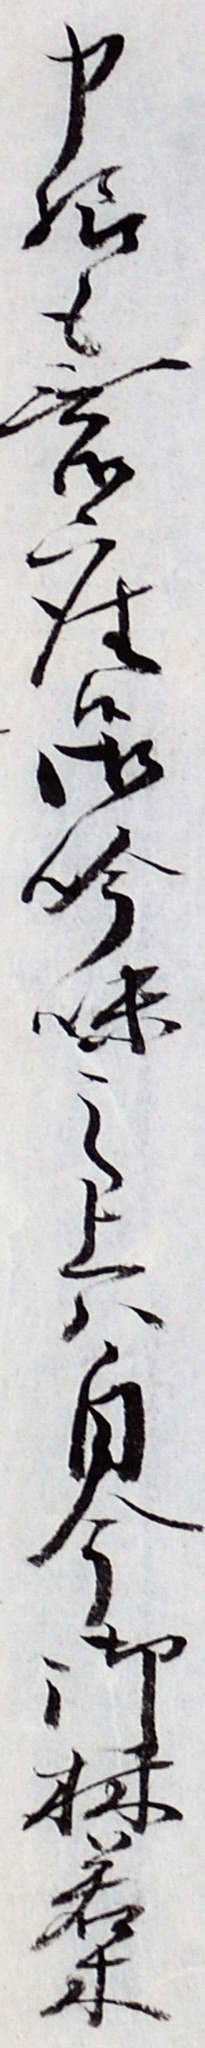申様も無御座候御吟味之上は自今御林若木
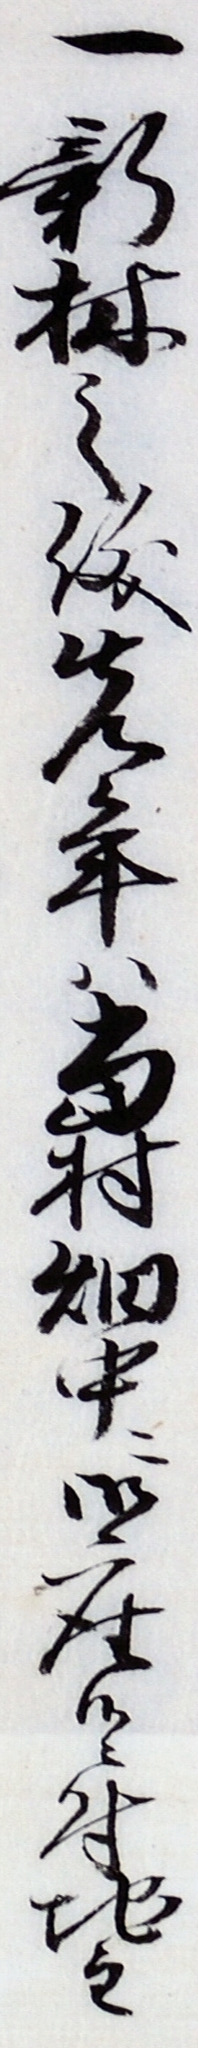一新林之儀先年は当村畑中に御座候に付地主
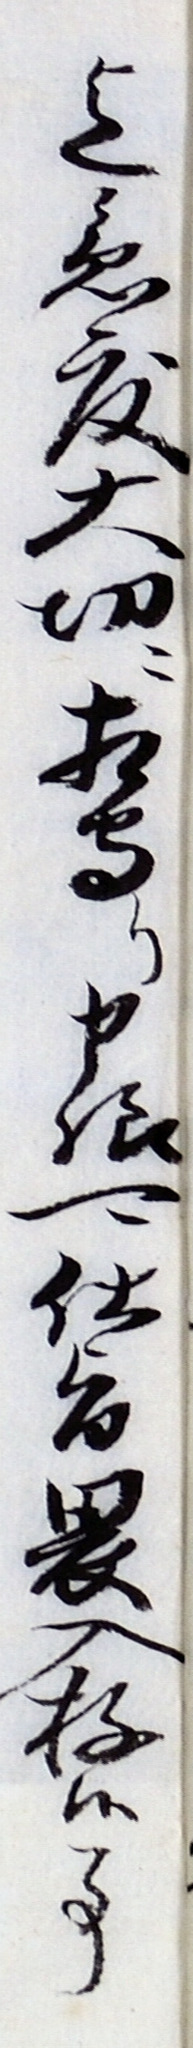迄急度大切に相守り申様可仕旨畏入存候事
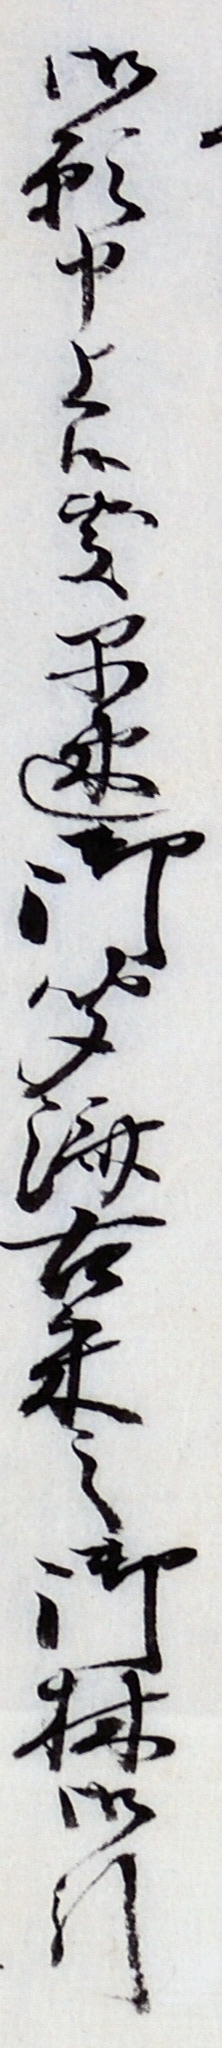御願申上候処早速御聞済古来之御林御引
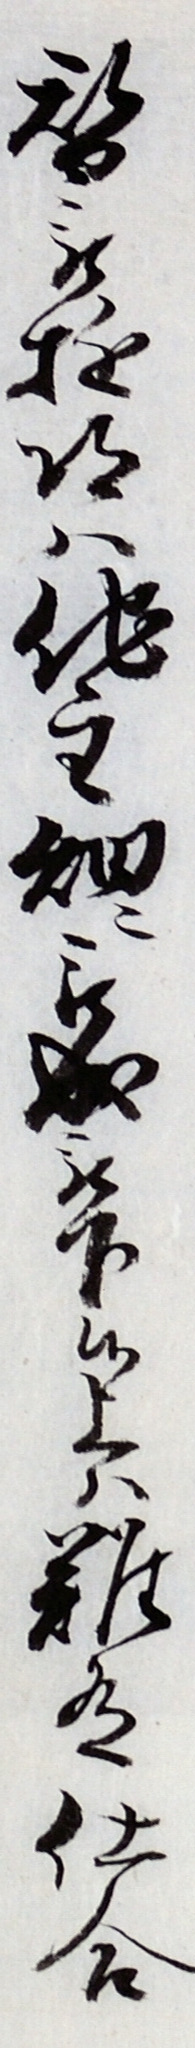替被遊跡ハ地主畑に被成被下候上は難有仕合
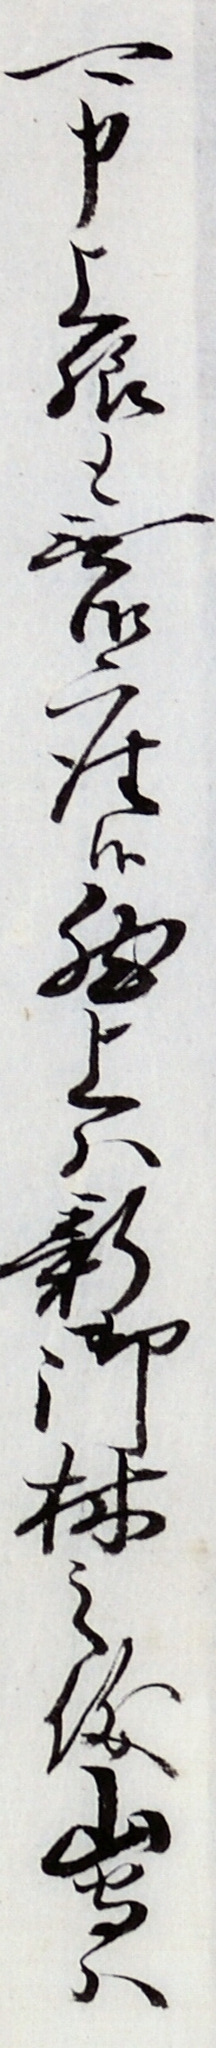可申上様も無御座候然上は新御林之儀山守は
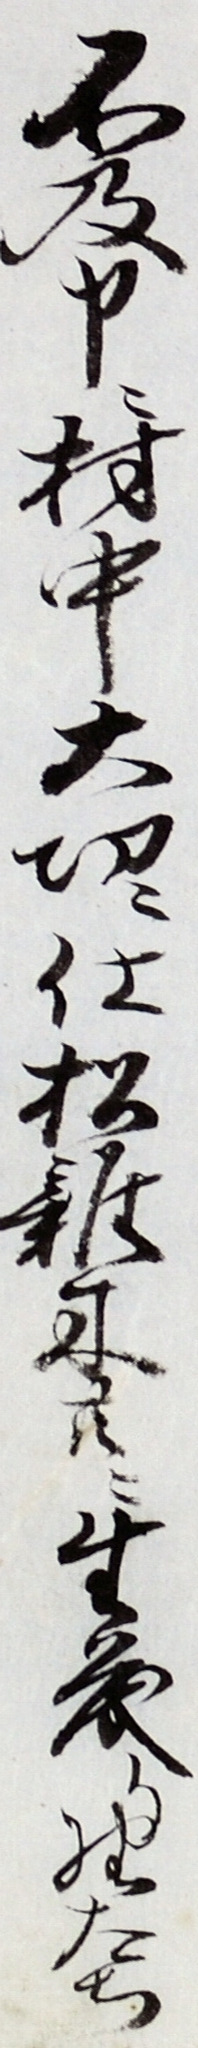不及申に村中大切に仕松雑木共に生茂り野たち
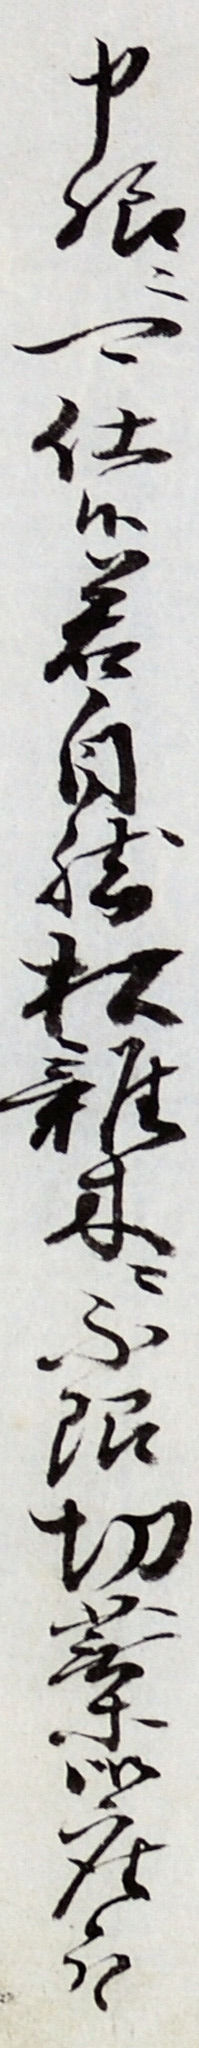申様に可仕候若自然松雑木に不限切蕪御座候はゝ
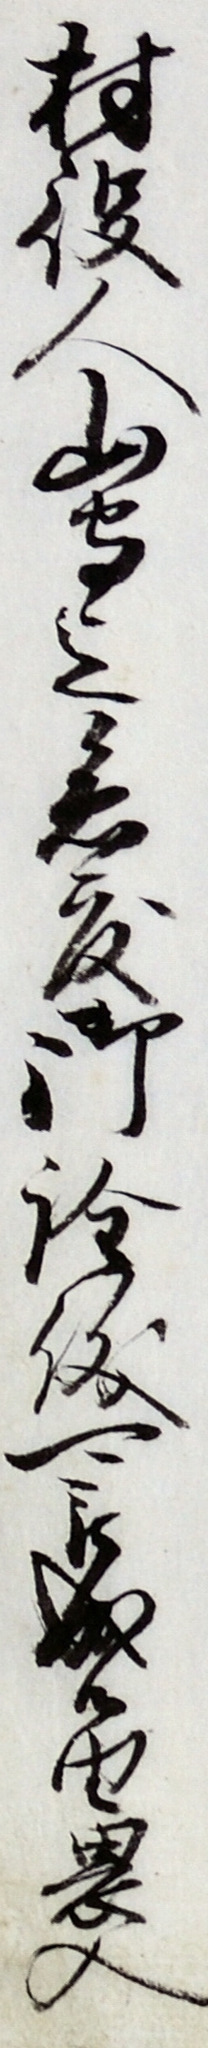村役人山守迄急度御詮儀可被成候由畏入

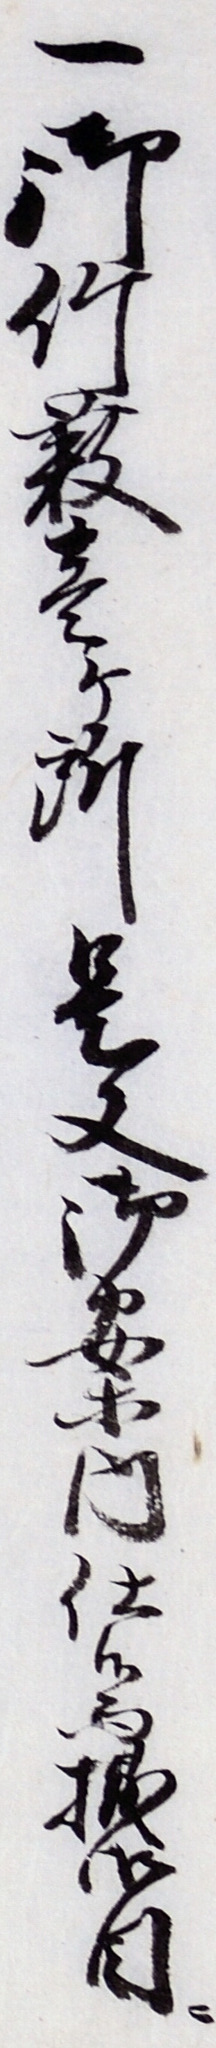一御竹薮壱ヶ所是又御案内仕候而掛御目ニ
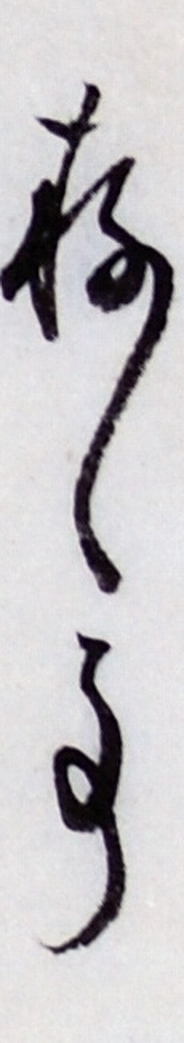存候事
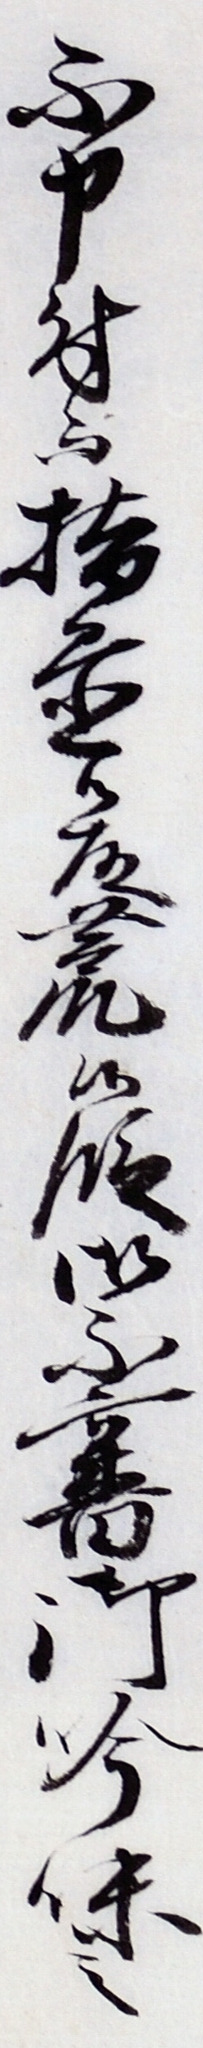不申付而指置候故荒候段御不審御吟味之
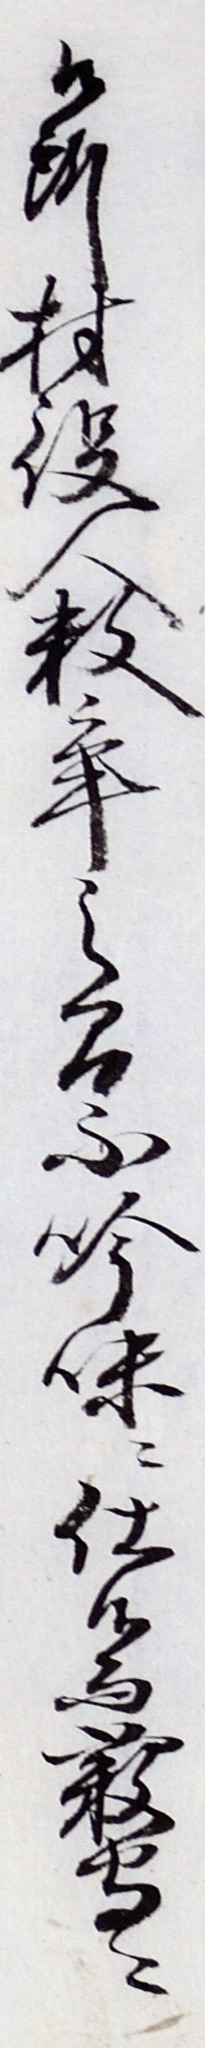候所村役人数年之間不吟味ニ仕候而薮守ニ
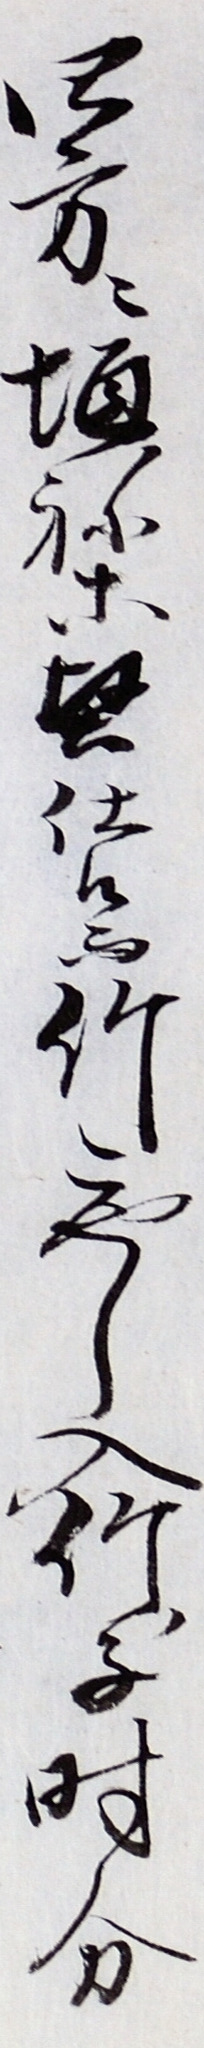四方ニ垣ね等堅仕候而竹戻し入竹ノ子時分
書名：御林御竹藪証文控
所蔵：伊那市立高遠町図書館・合同会社AMANE
